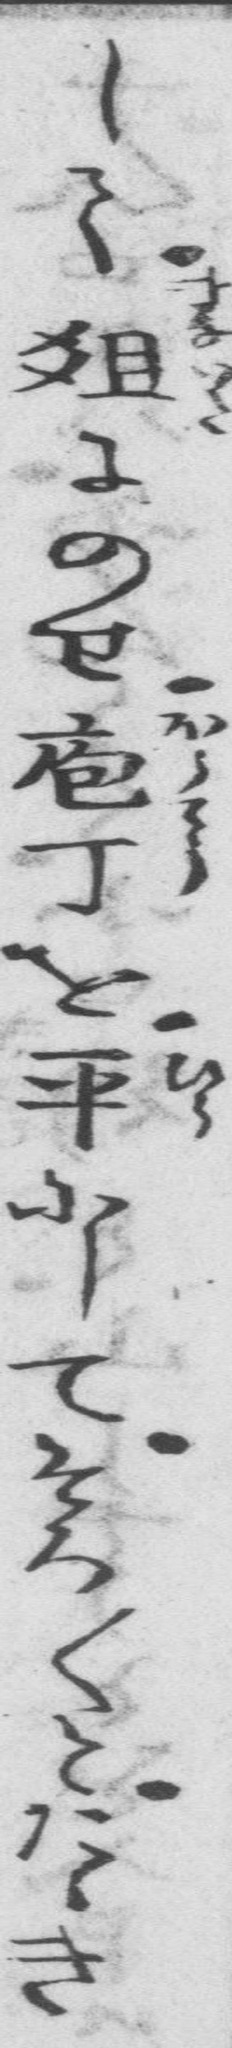して。俎にのせ。包丁を。平にして。そろ〳〵と。たゝき
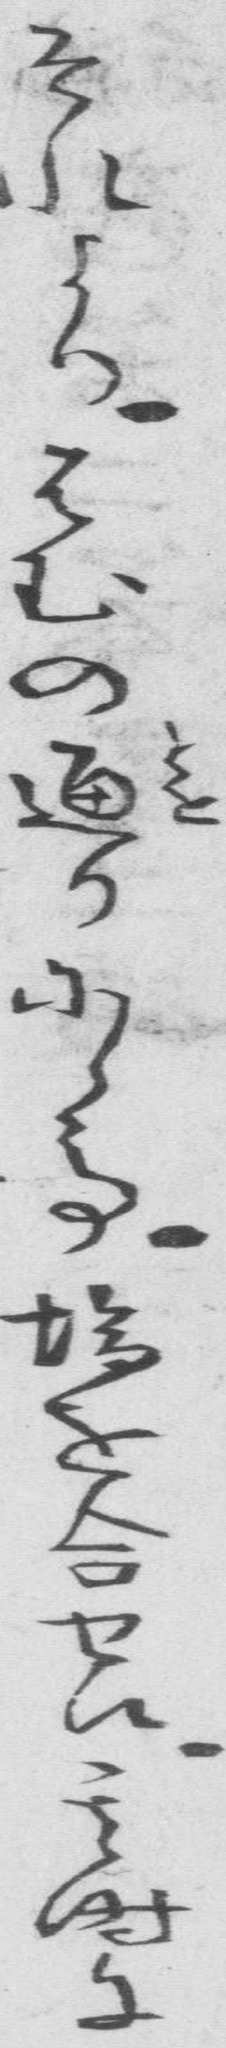それより。はむの通りにして。塩を合せ候。其時に
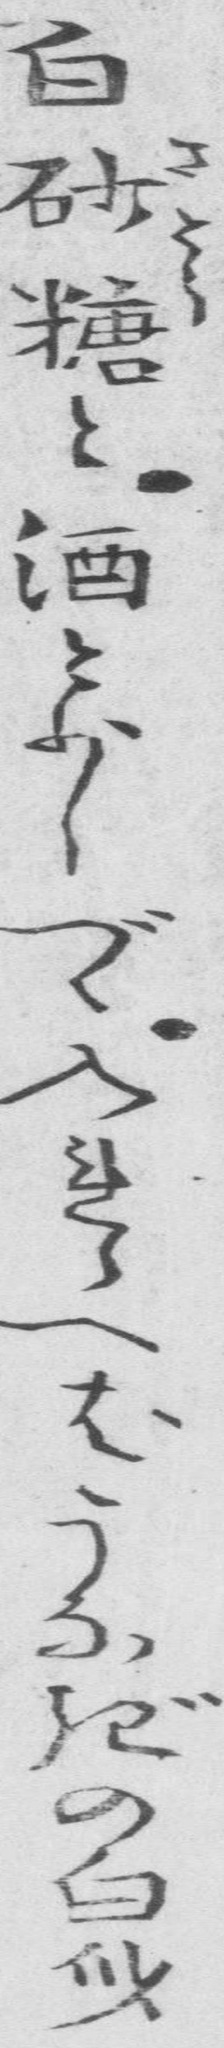白砂糖と。酒と少しづゝ。入れ候へばうなぎの白身
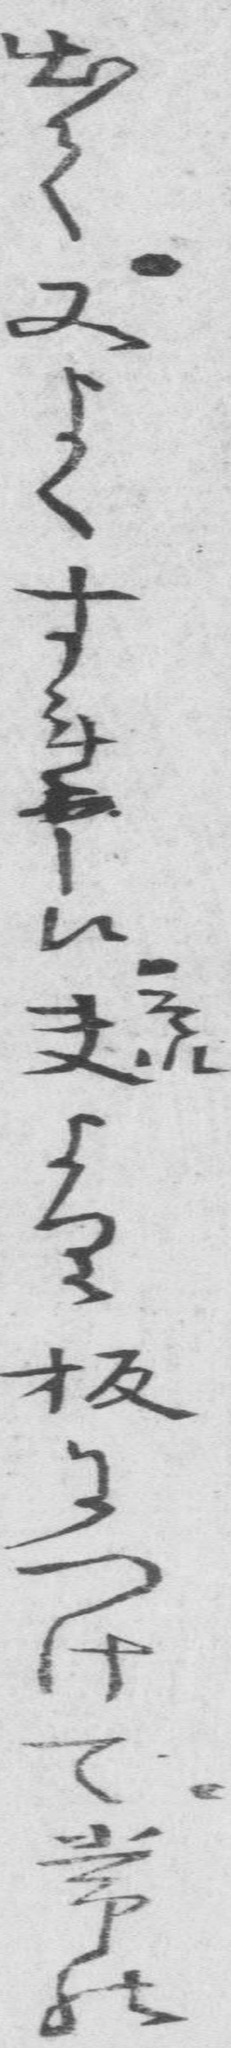出て。又よくすき申候。夫より板につけて。常の
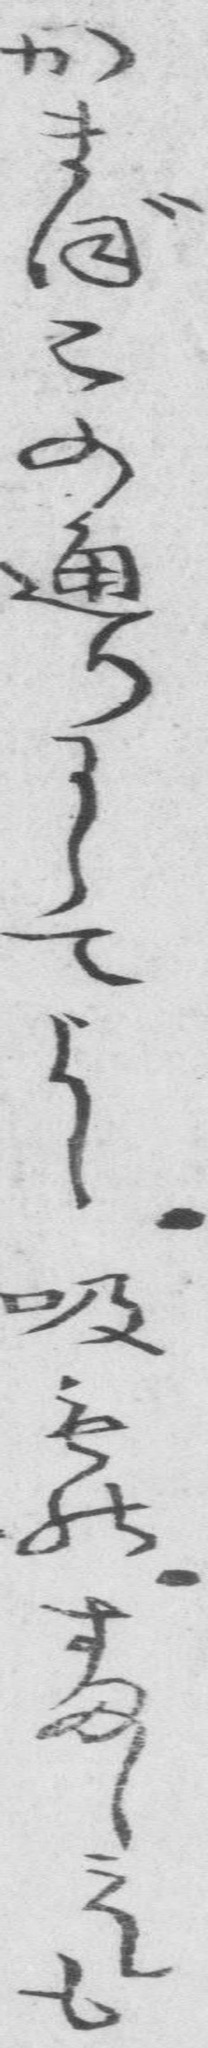かまぼこの通りにしてよし。吸もの。すましにても
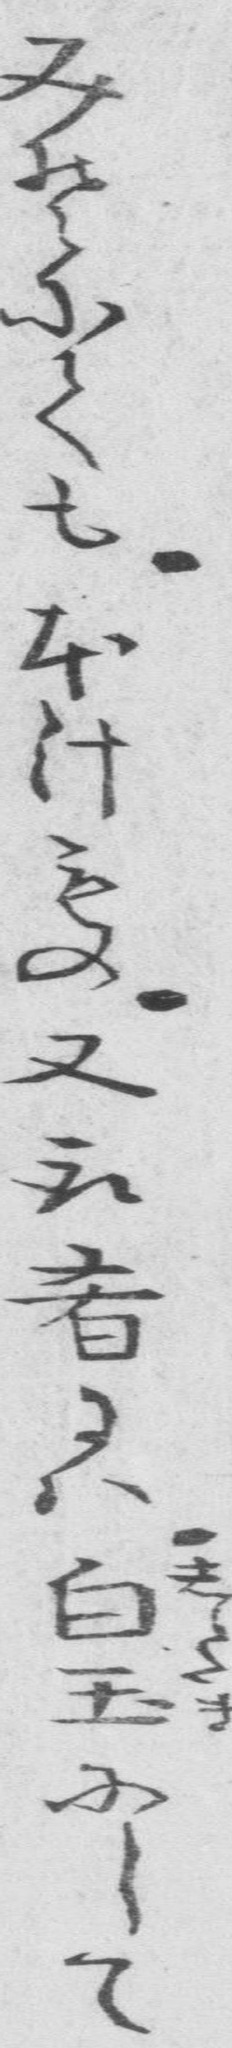みそにても。本汁もの。又取肴には。白玉にして
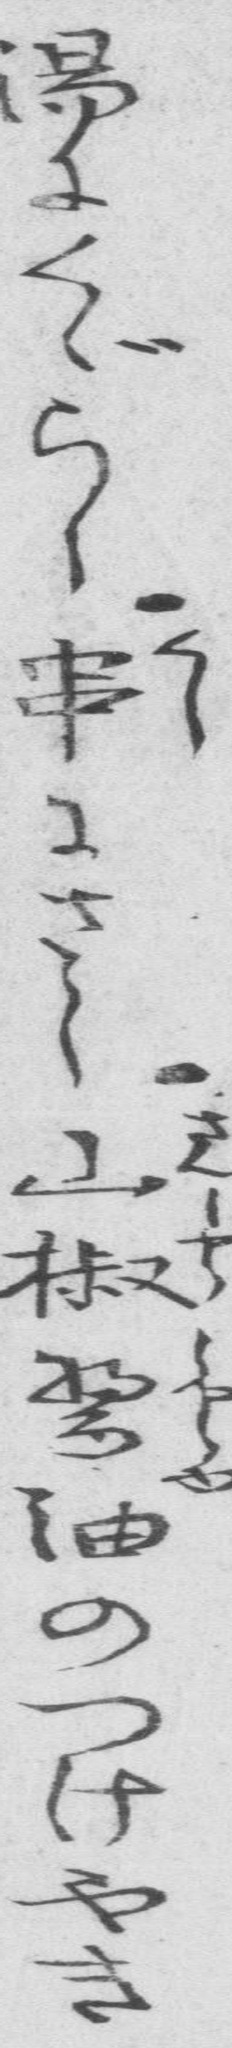湯にくゞらし。串にさし。山椒醤油のつけやき
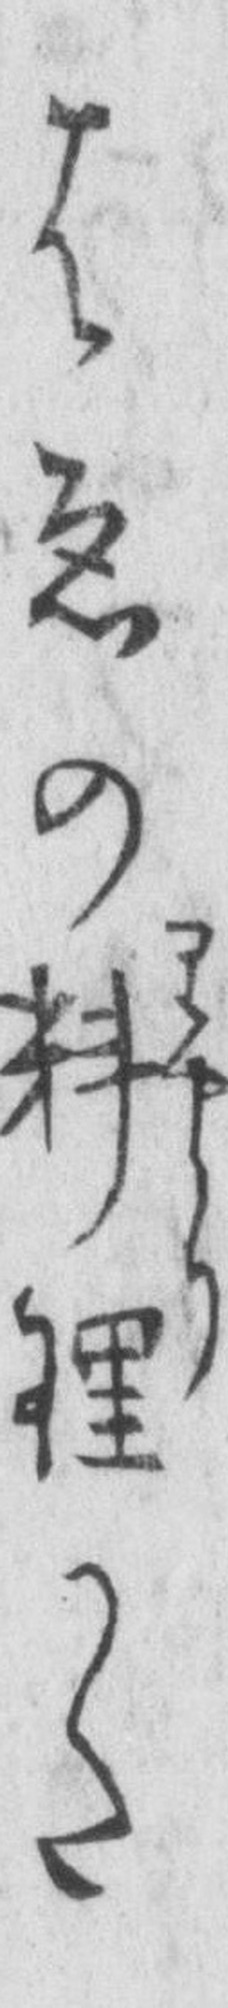はゑの料理かた
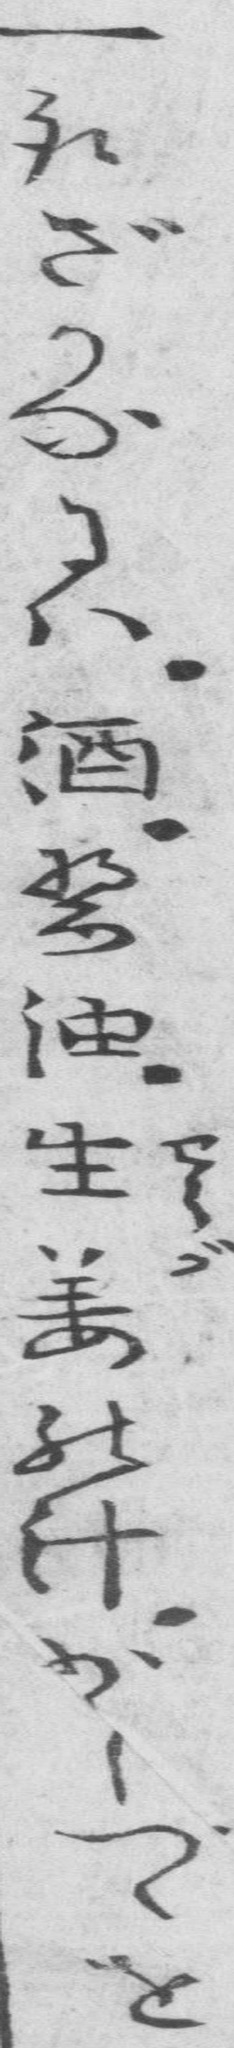一取ざかなには。酒。醤油。生姜の汁。少しづゝを
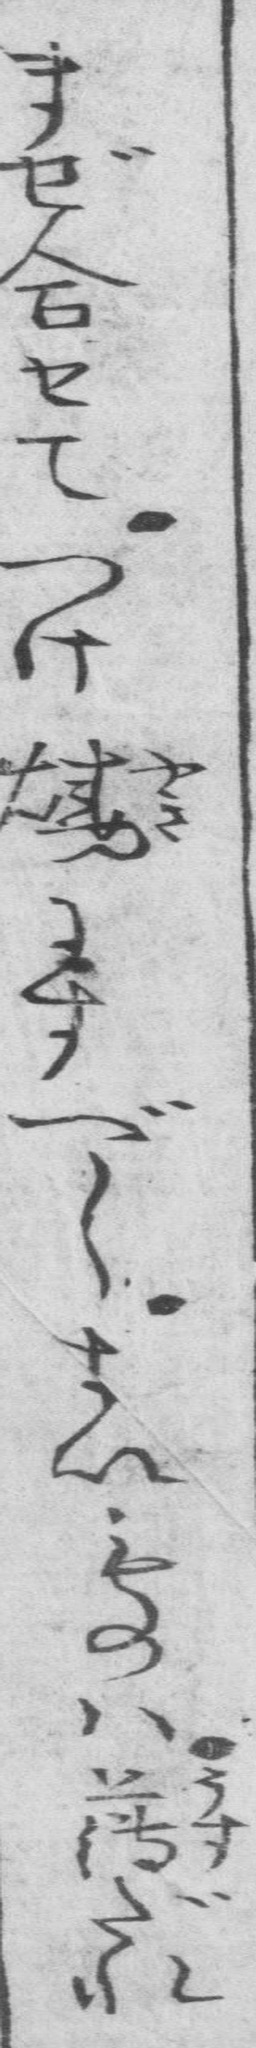まぜ合せて。つけ焼にすべし。すいものは。薄だれ

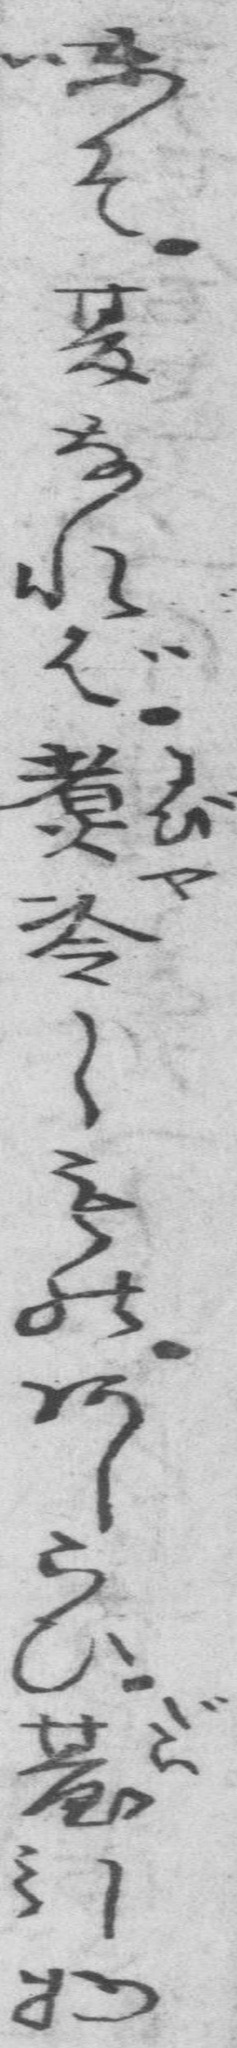味そ。夏なれば。煎冷しもの。あしらひ。台引物
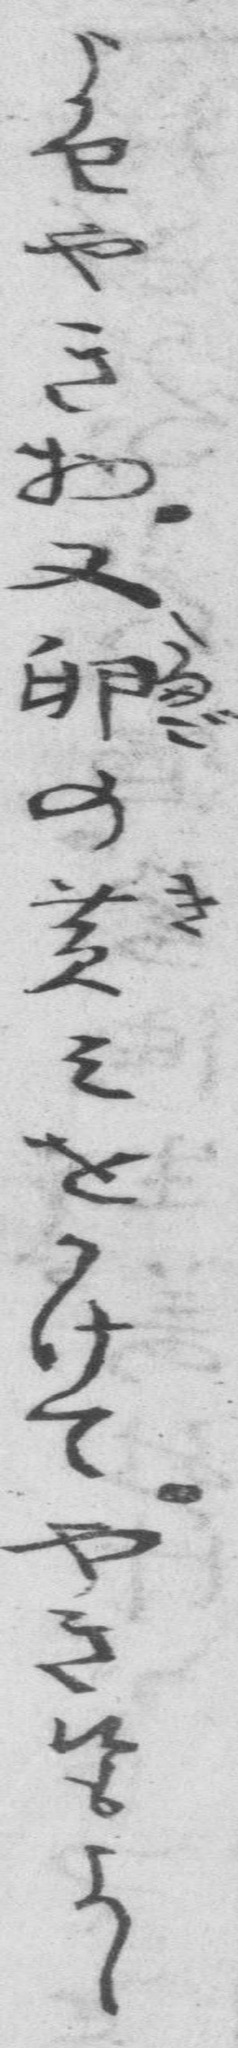よせやき物。又卵の黄みをかけて。やき候もよし
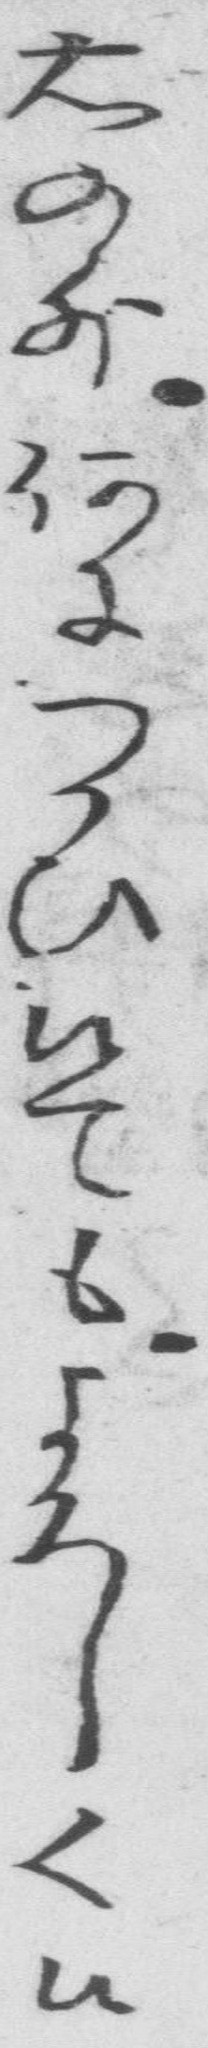右の外。何につかひ候ても。よろしく候
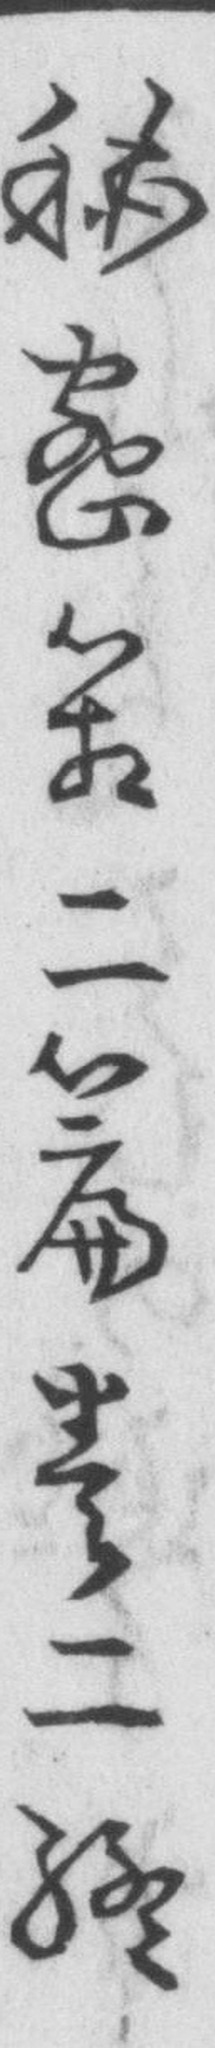秘密箱二篇巻二終

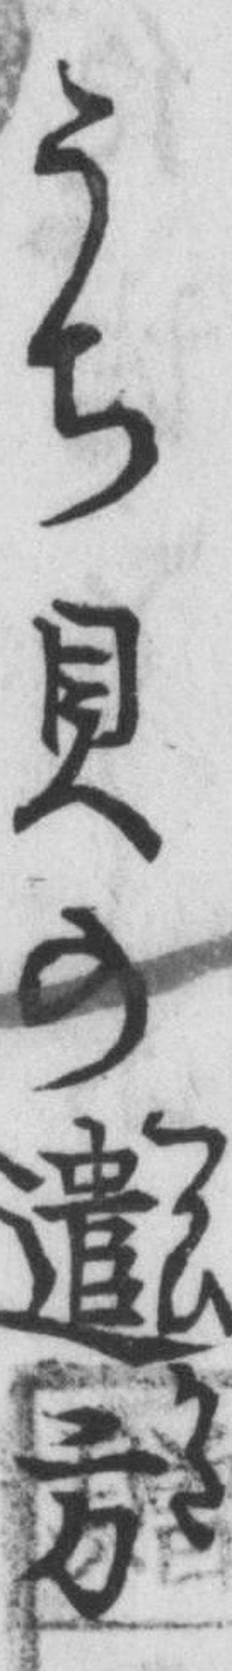うち貝の遣方
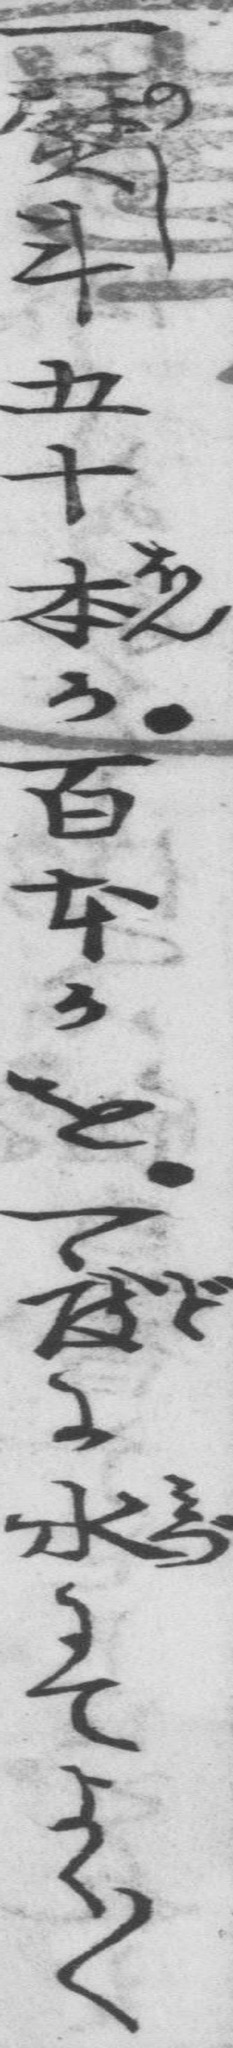一熨斗五十本か。百本かを。一度に水にてよく〳〵
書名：萬寳料理秘密箱
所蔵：大阪府立大学学術情報センター 国文学研究資料館
